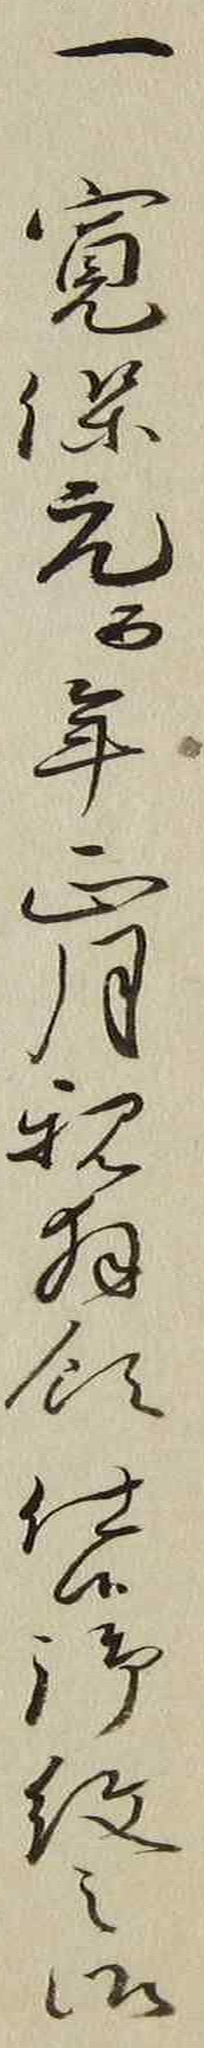一寛保元酉年正月親拝領仕候御紋之御
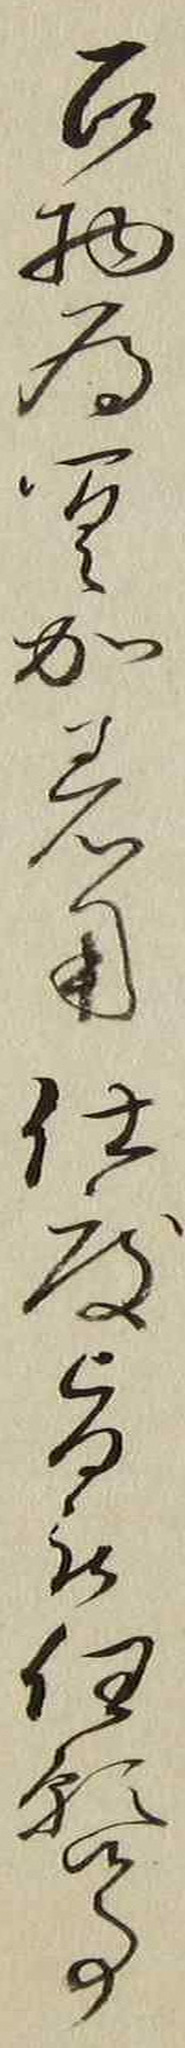召物為冥加着用仕度旨被任願候事
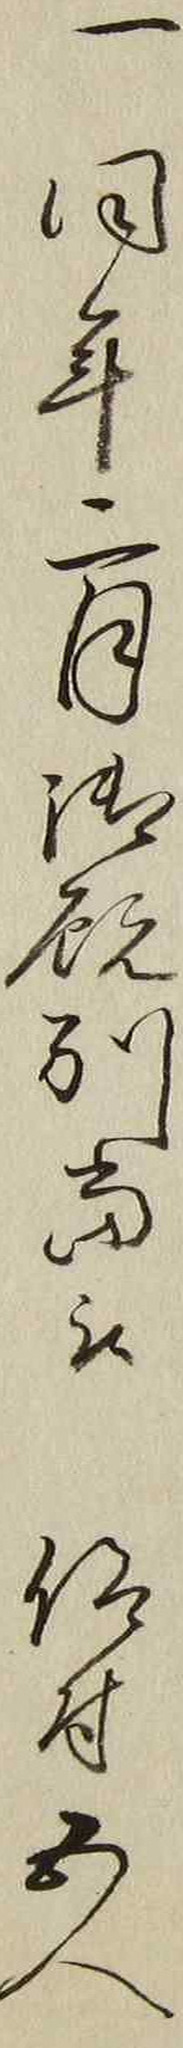一同年二月御厩別当被仰付五人
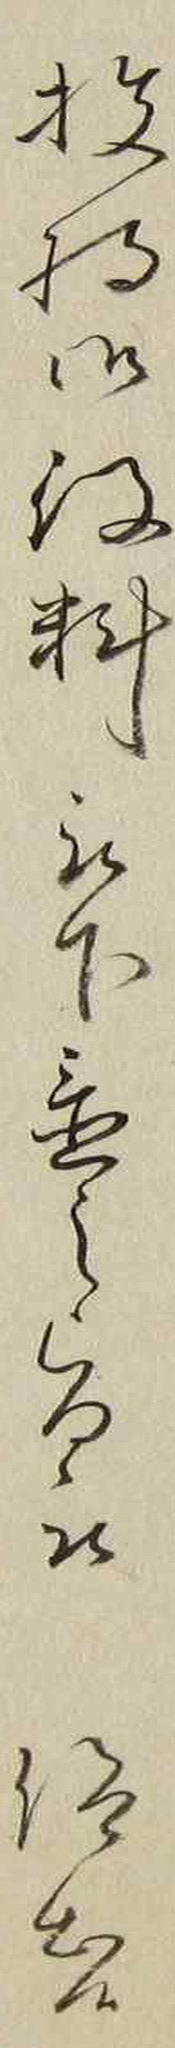扶持御役料被下置之旨被仰出候
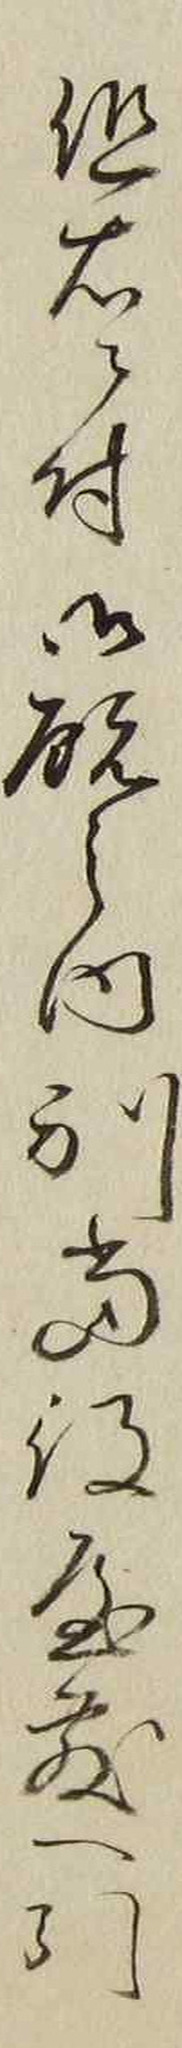但右ニ付御厩之内別当役屋敷へ引
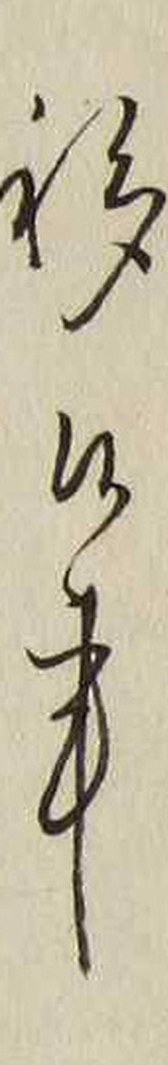移候事

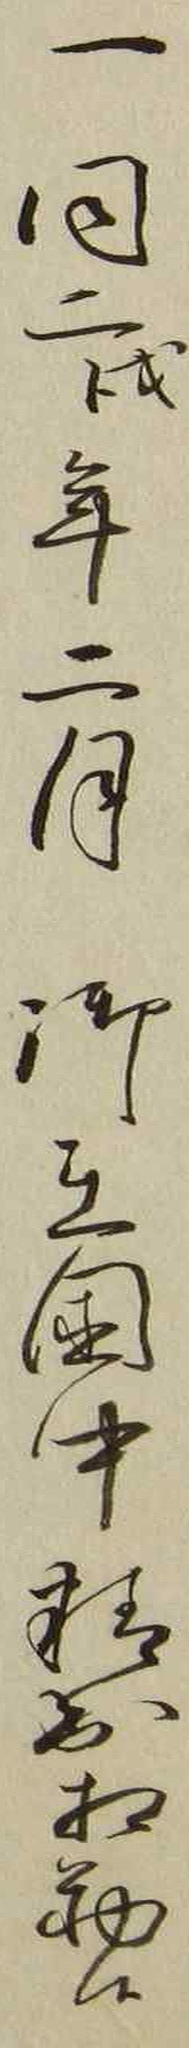一同二戌年二月御在国中精出相勤候
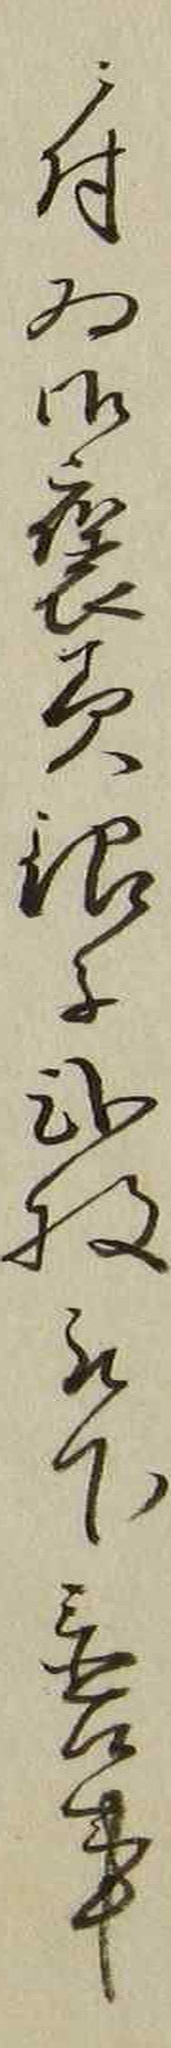ニ付為御褒美銀子弐枚被下置候事
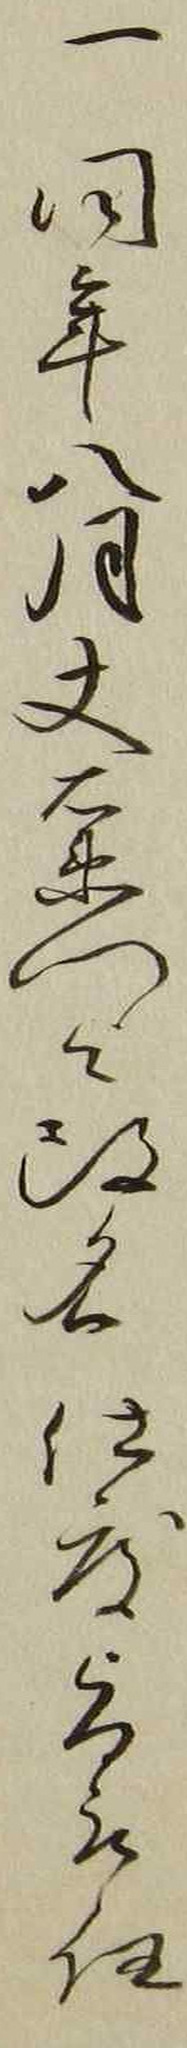一同年八月丈右衛門と改名仕度旨被任
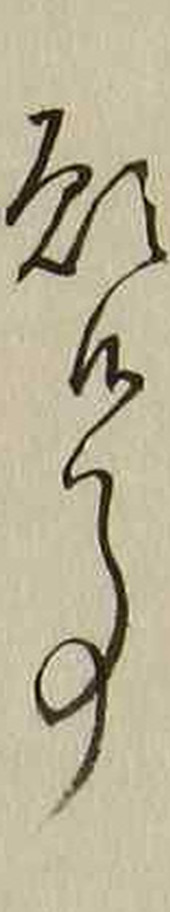願候事
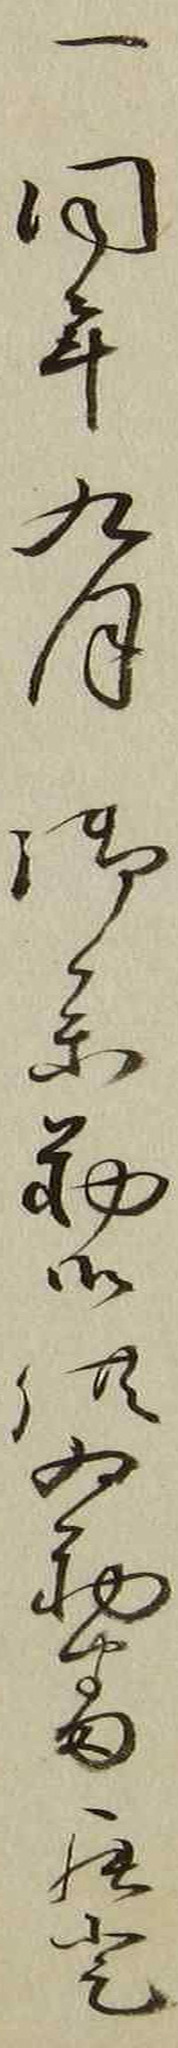一同年九月御参勤御供為勤番罷登
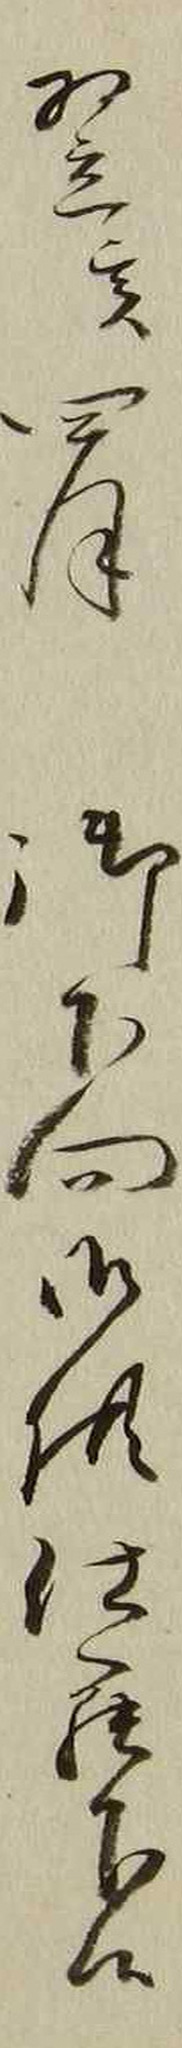翌亥四月御下向御供仕罷下候
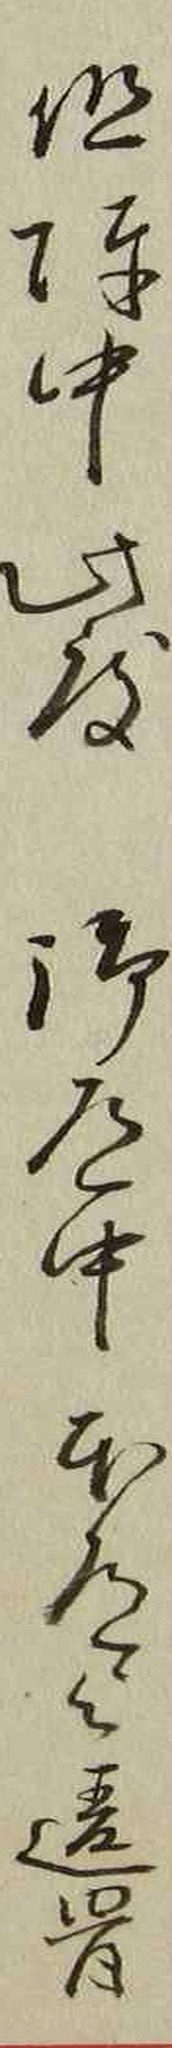但陣中此度御道中本道と違骨
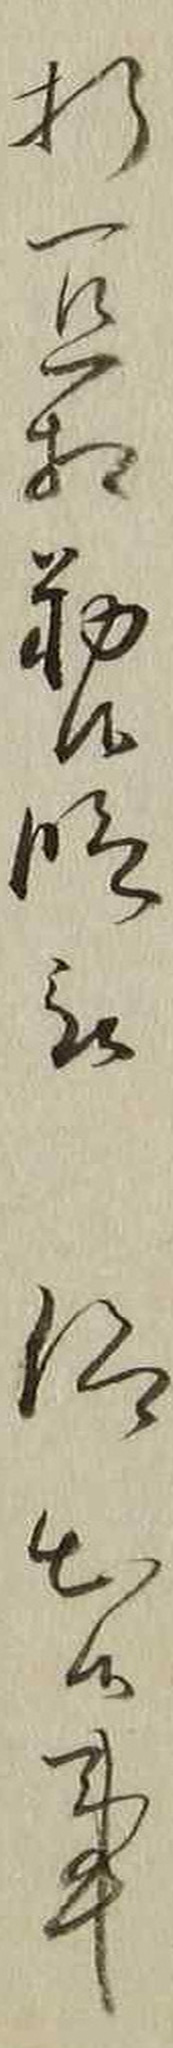折宜相勤候段被仰出候事
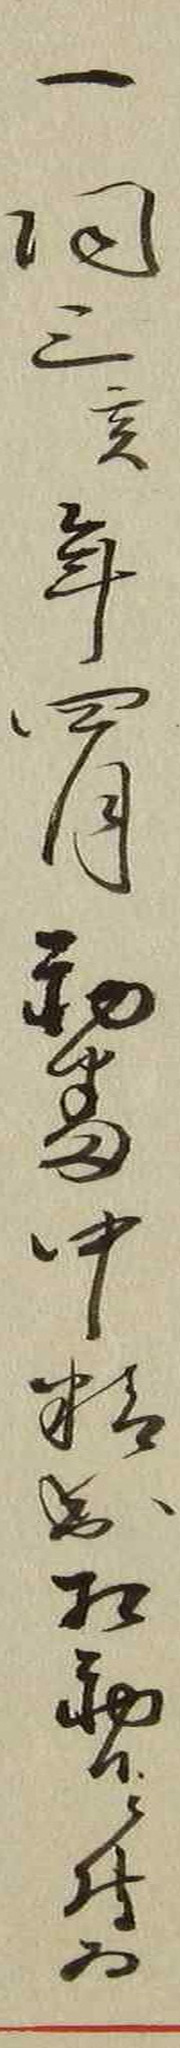一同三亥年四月勤番中精出相勤候ニ付為
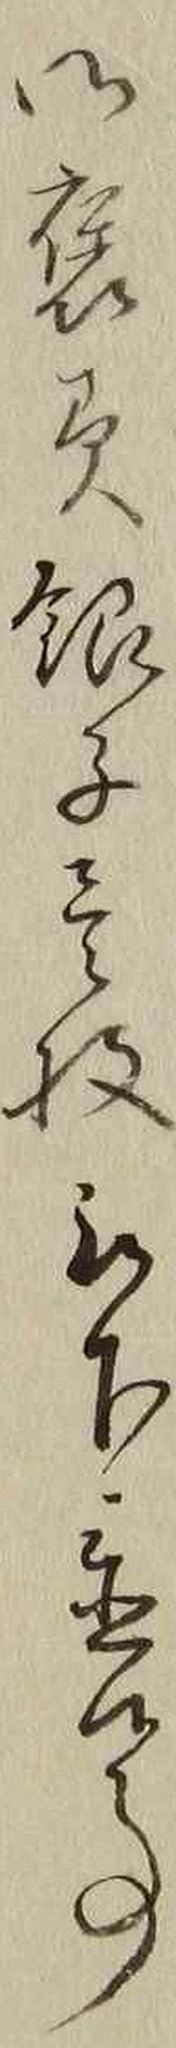御褒美銀子壱枚被下置候事
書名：諸士系譜　巻之3　い之部3
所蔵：会津若松市立会津図書館
